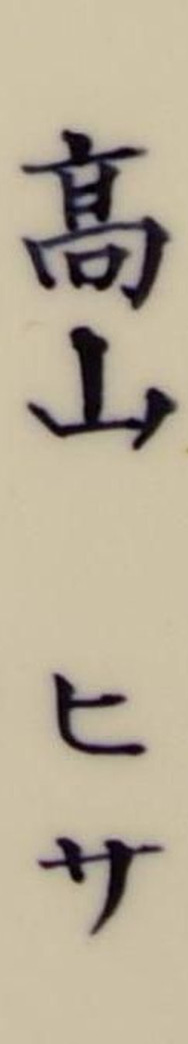高山ヒサ
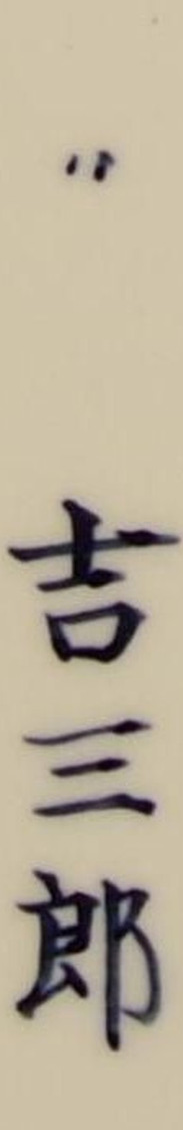吉三郎
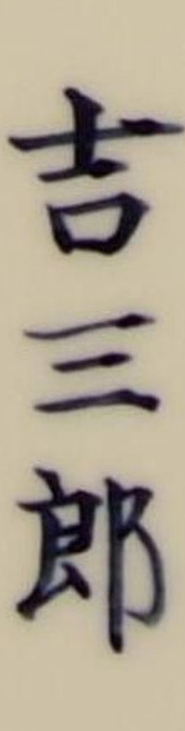吉三郎
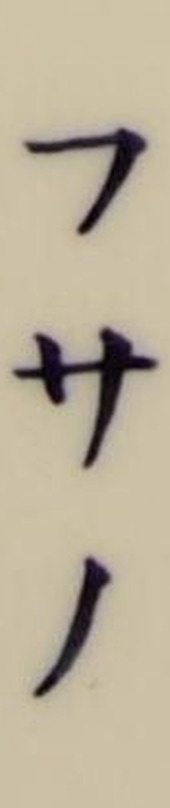フサノ
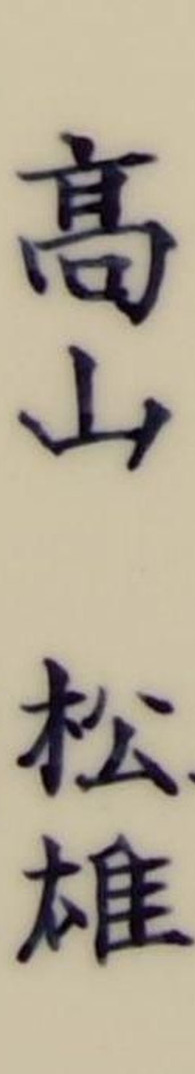高山松雄
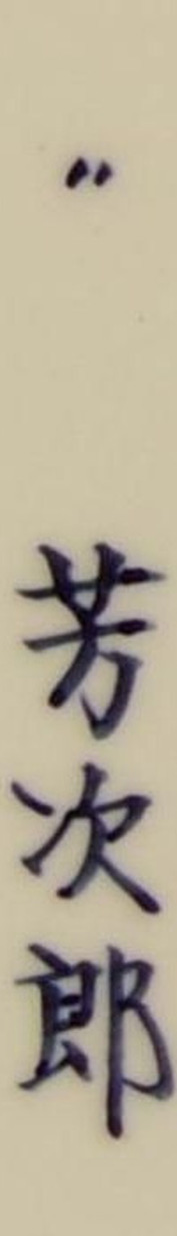芳次郎
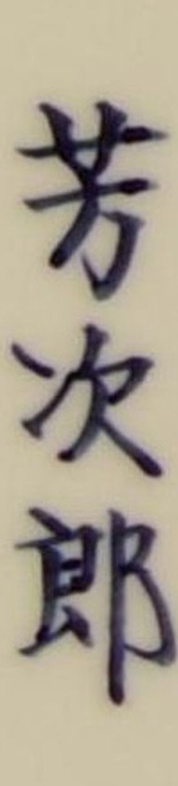芳次郎
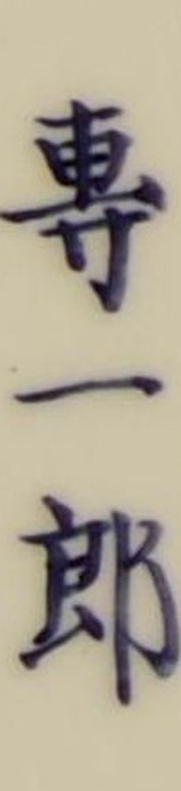専一郎
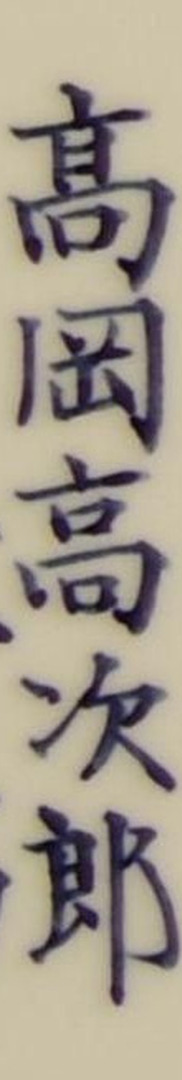高岡高次郎
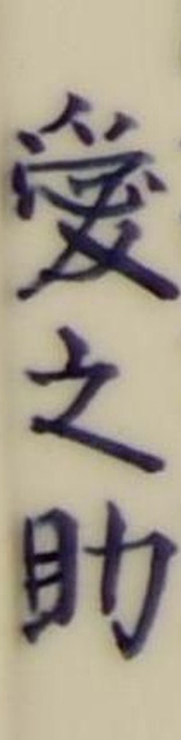愛之助

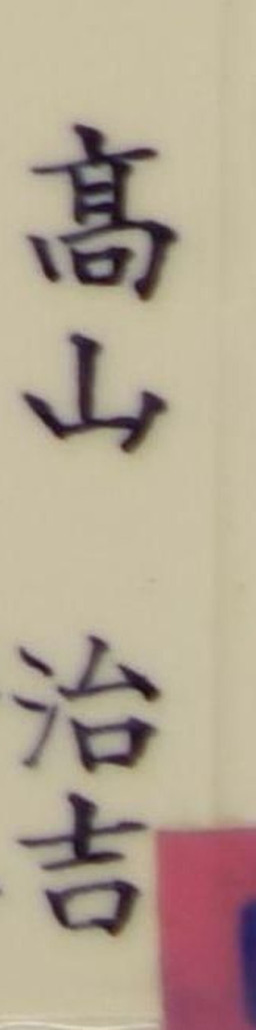高山治吉
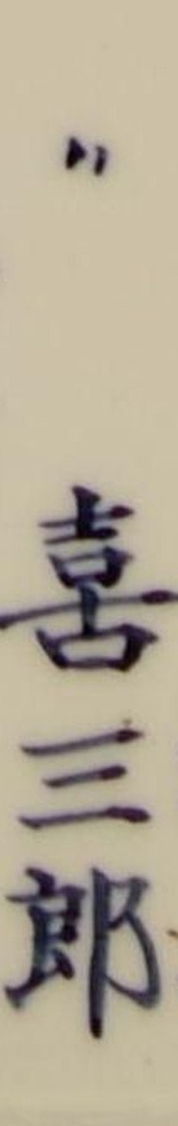喜三郎
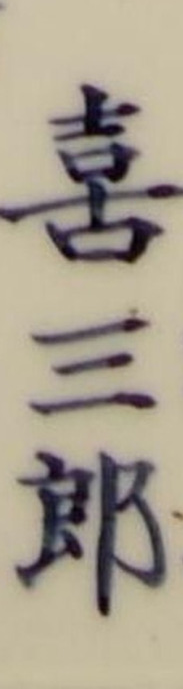喜三郎
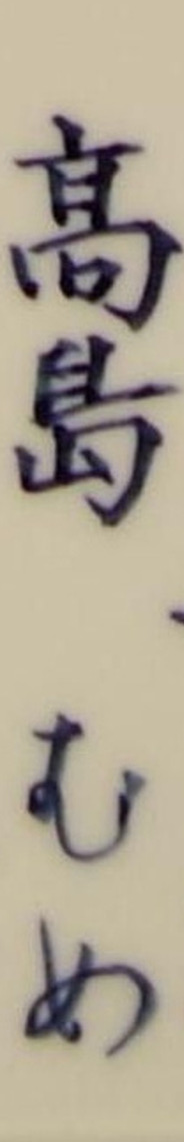高島むめ
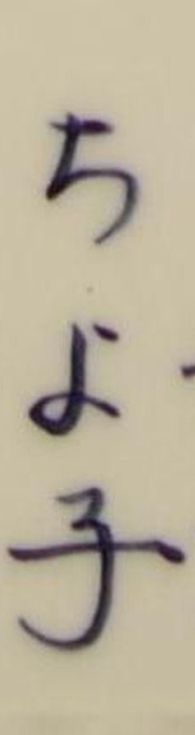ちよ子
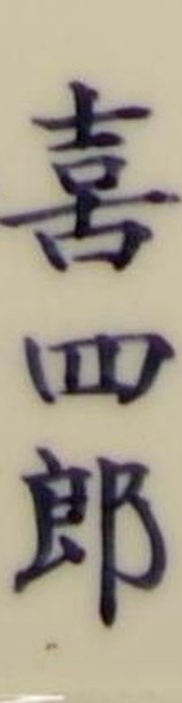喜四郎
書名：E~L
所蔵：高野山金剛峯寺
